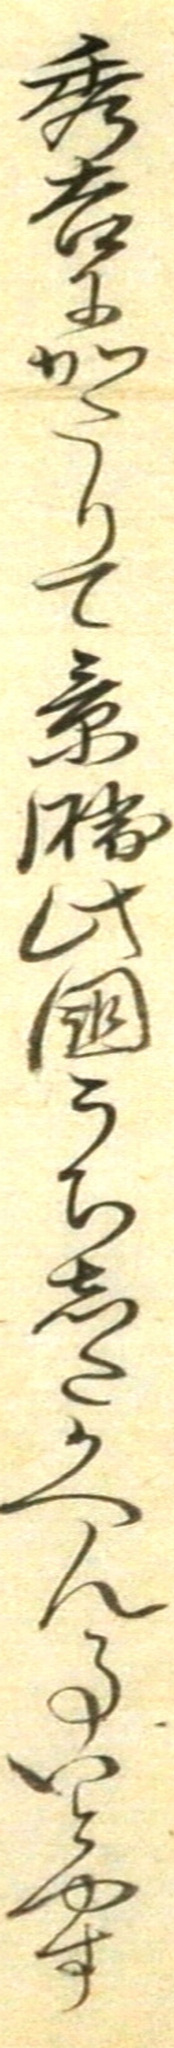秀吉にかたりて景勝此国うちしたかへん事いとやす
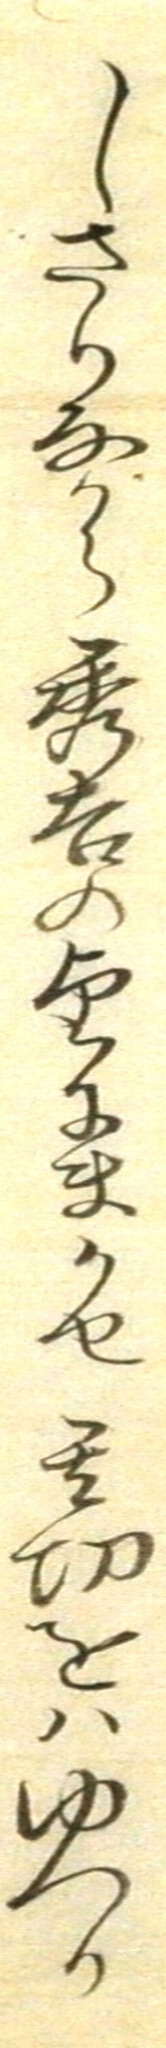しさりなから秀吉の望にまかせ其功をはゆつり
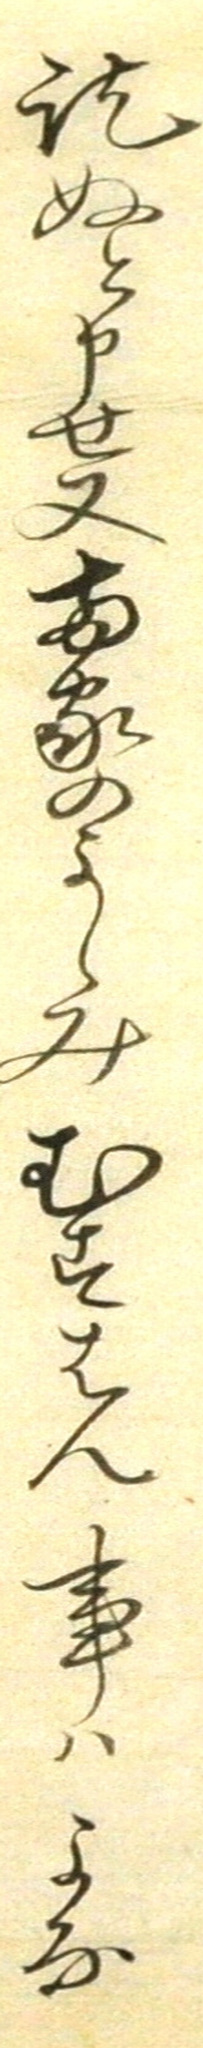訖ぬと申せ又両家のよしみむすはん事はよな
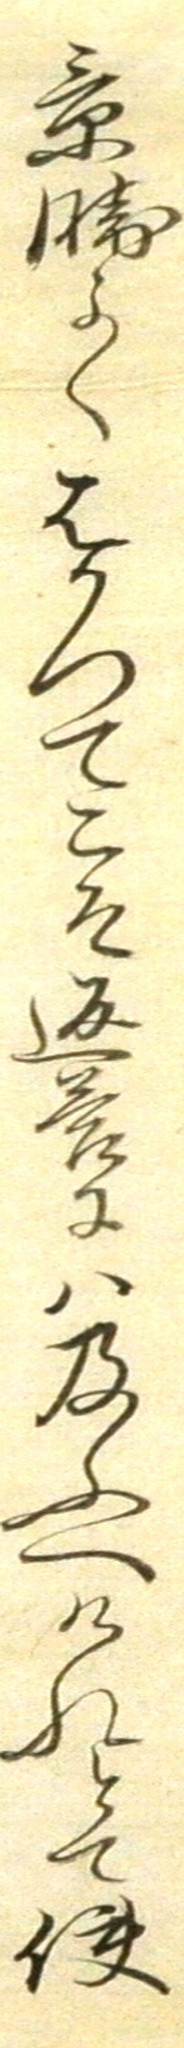景勝よくはかつてこそ返答には及ふへけれとて使
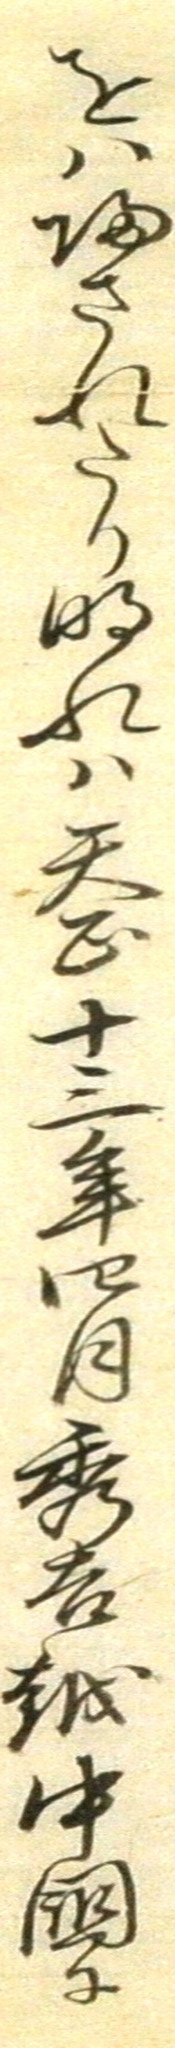をは帰されたり明れは天正十三年四月秀吉越中国に
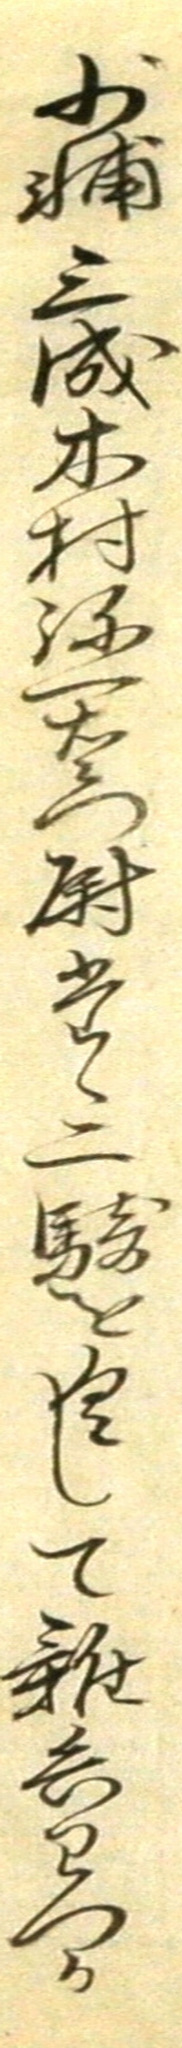少輔三成木村弥一右衛門尉たゝ二騎を具して雑兵わつか
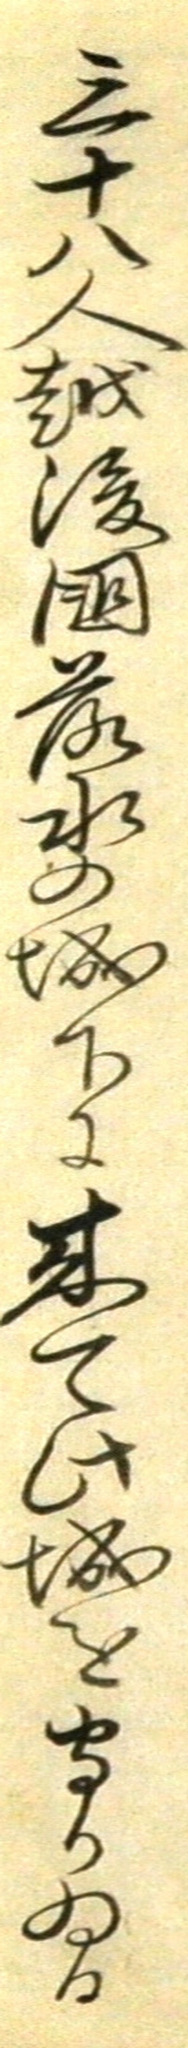三十八人越後国落水の城下に来て此城を守りゐる
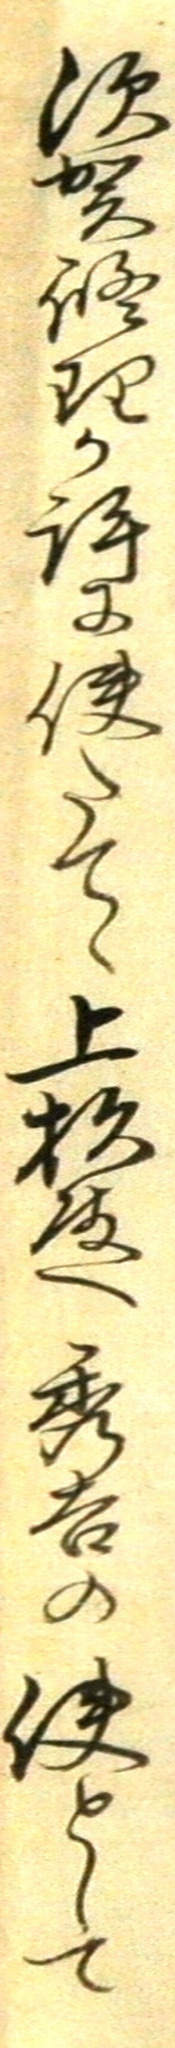須賀修理か許に使たてゝ上杉殿へ秀吉の使として

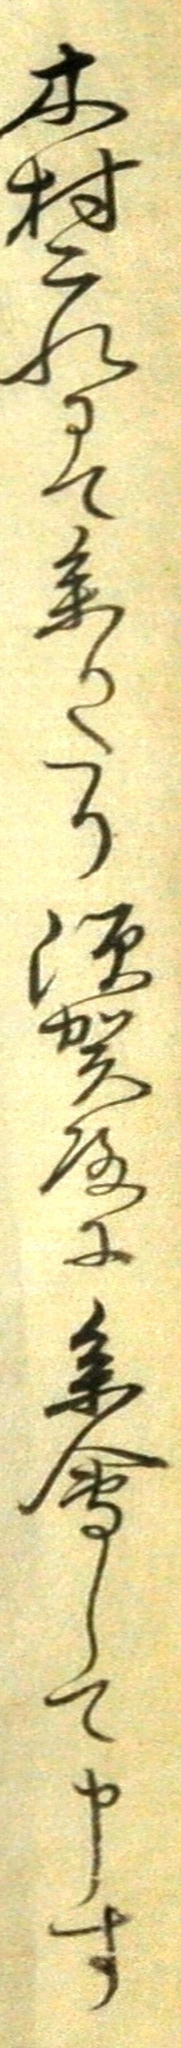木村これにて参りたり須賀殿に参会して申す
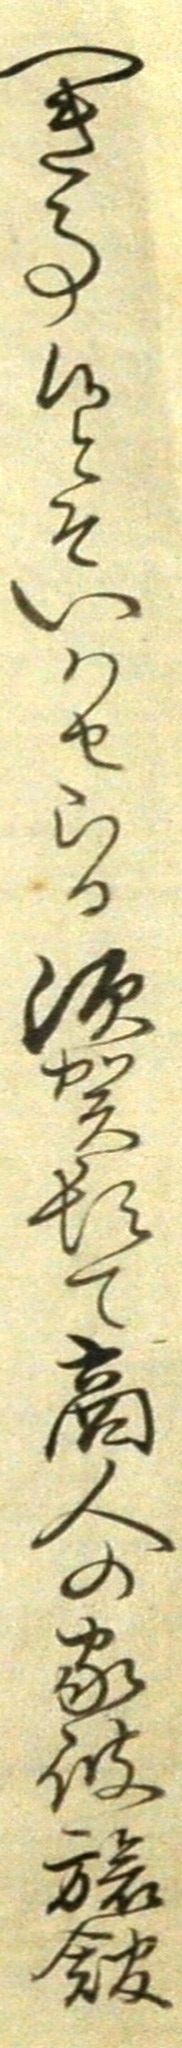へき事候とそいわせらる須賀頓て商人の家彼旅館
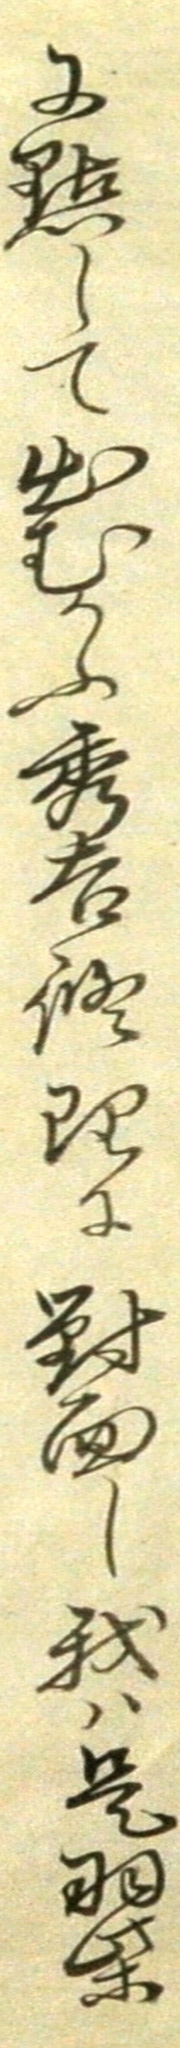に点して出むかふ秀吉修理に対面し我は是羽柴
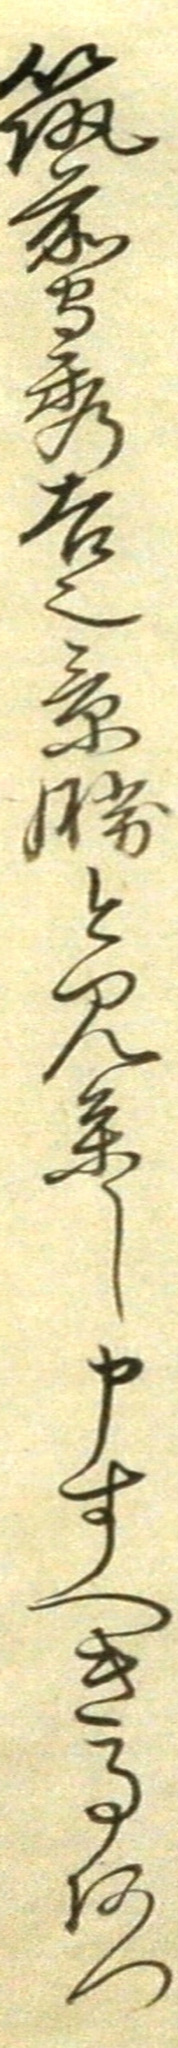筑前守秀吉也景勝と見参し申すへき事あつ
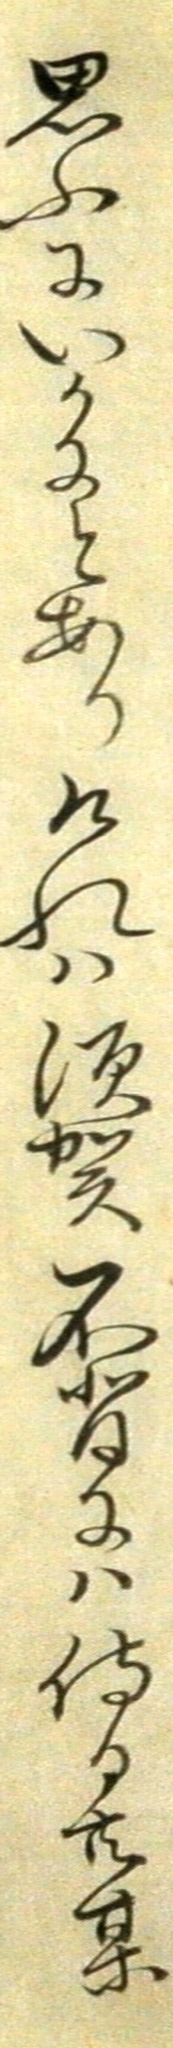思ふにいかにとありけれは須賀不背には侍る共某
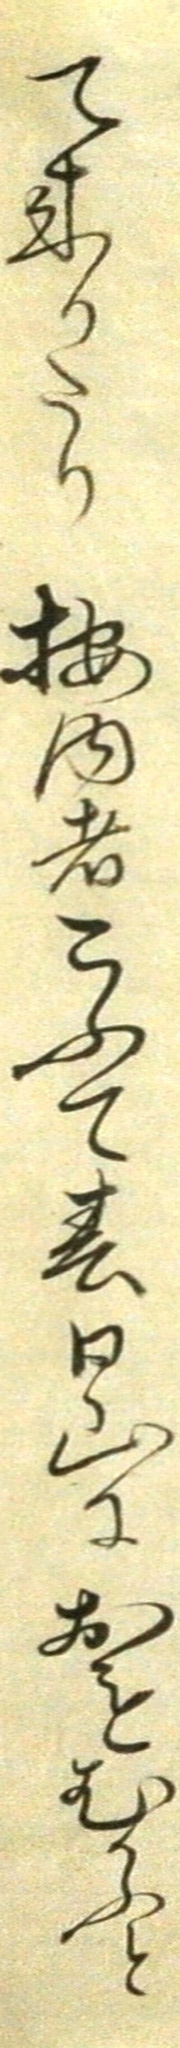て来りたり案内者こふて春日山におもむかふと
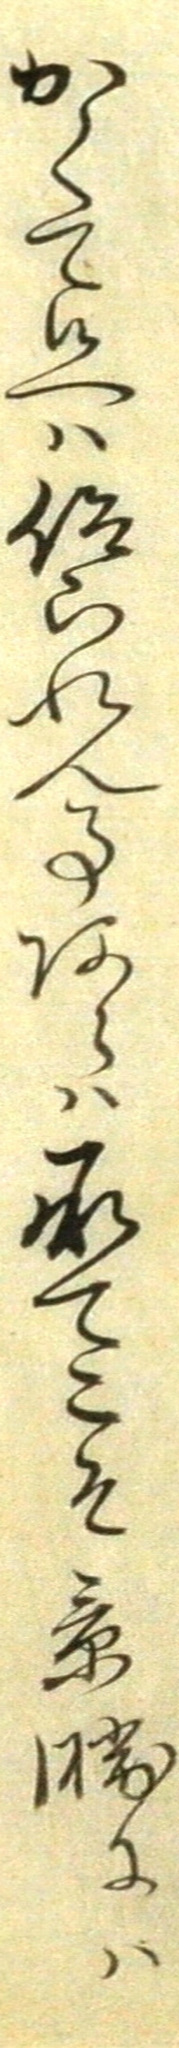かくて候へは仰られん事あらは承てこそ景勝には
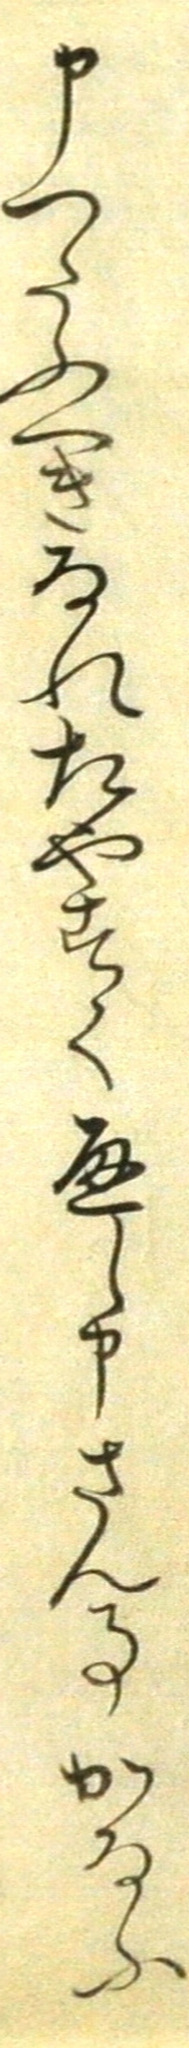申つたふへきなれたやすく通し申さん事かなふ
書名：藩翰譜（八・下）
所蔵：伊那市立高遠町図書館・合同会社AMANE
